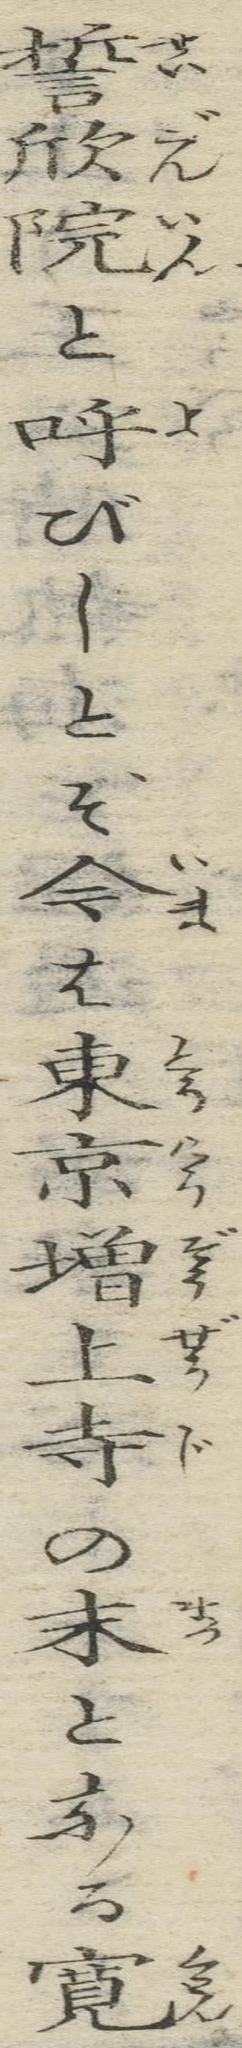誓欣院と呼びしとぞ今は東京増上寺の末となる寛
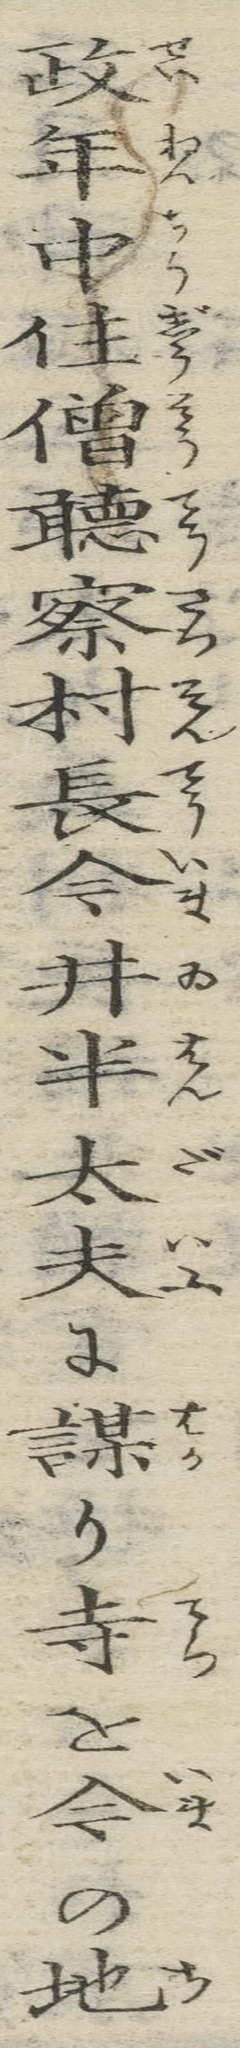政年中住僧聴察村長今井半太夫に謀り寺を今の地
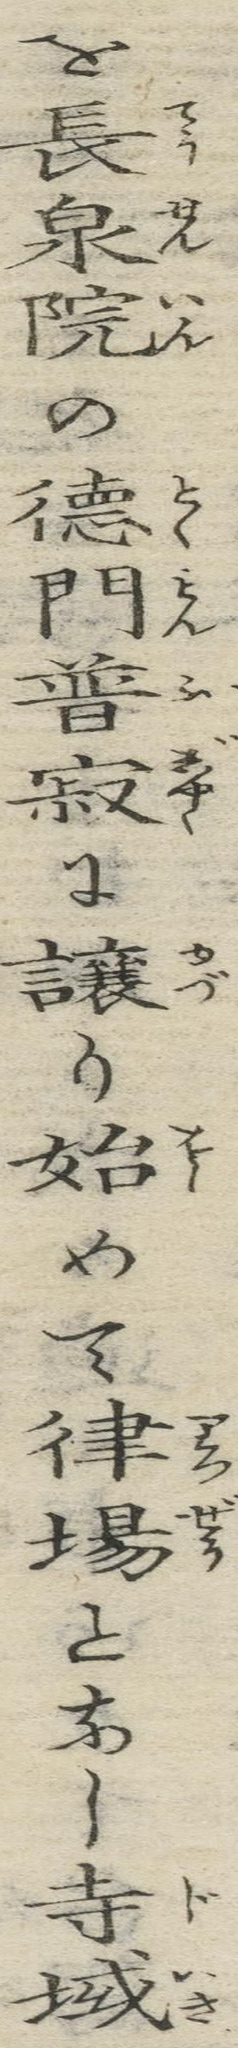を長泉院の徳門普寂に譲り始めて律場となし寺域
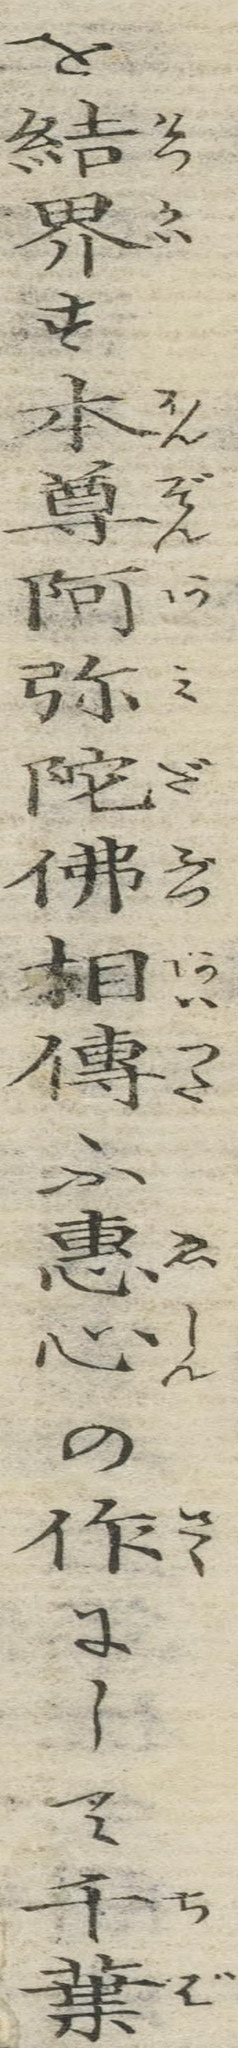を結界す本尊阿弥陀仏相伝ふ恵心の作にして千葉
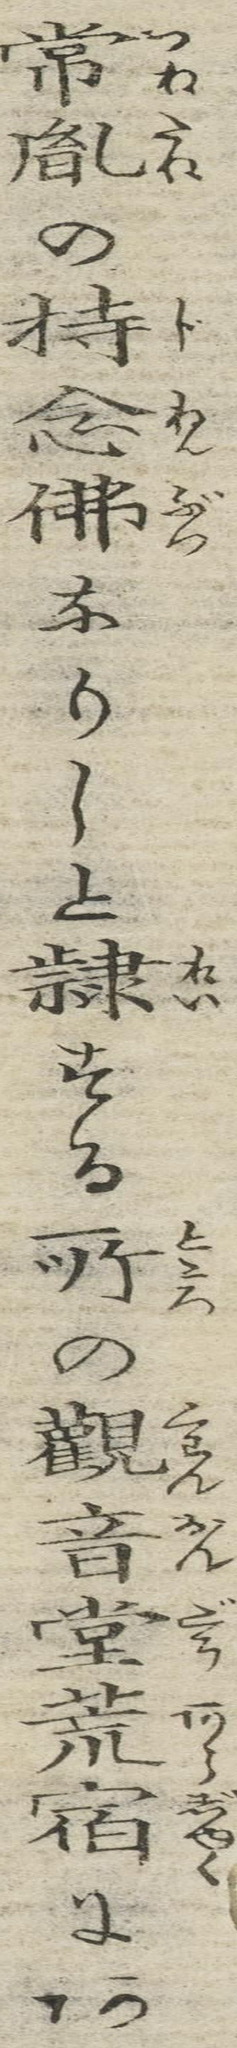常胤の持念仏なりしと隷する所の観音堂荒宿にあ
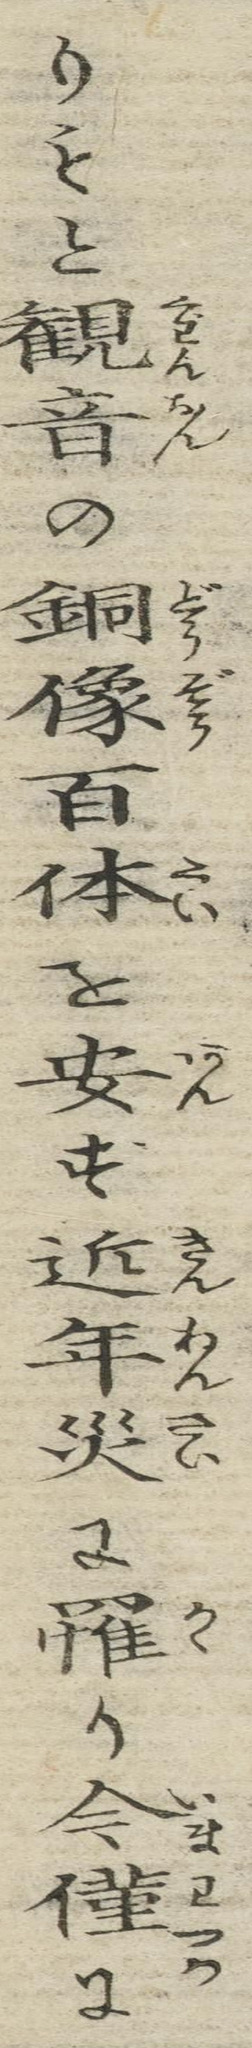りもと観音の銅像百体を安す近年災に罹り今僅に

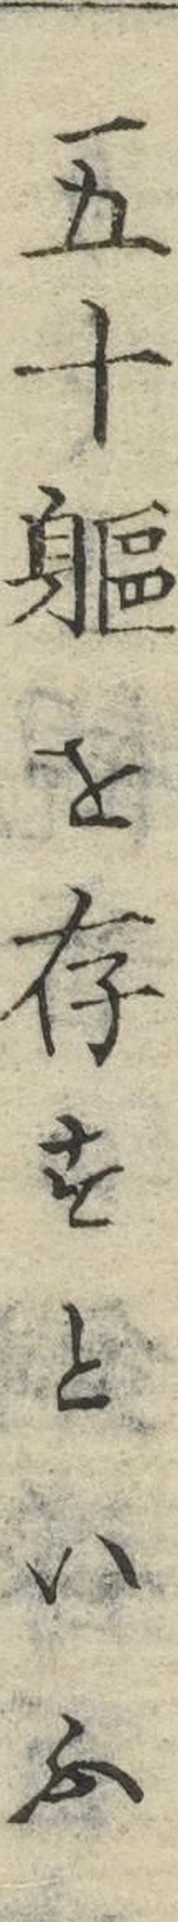五十躯を存すといふ
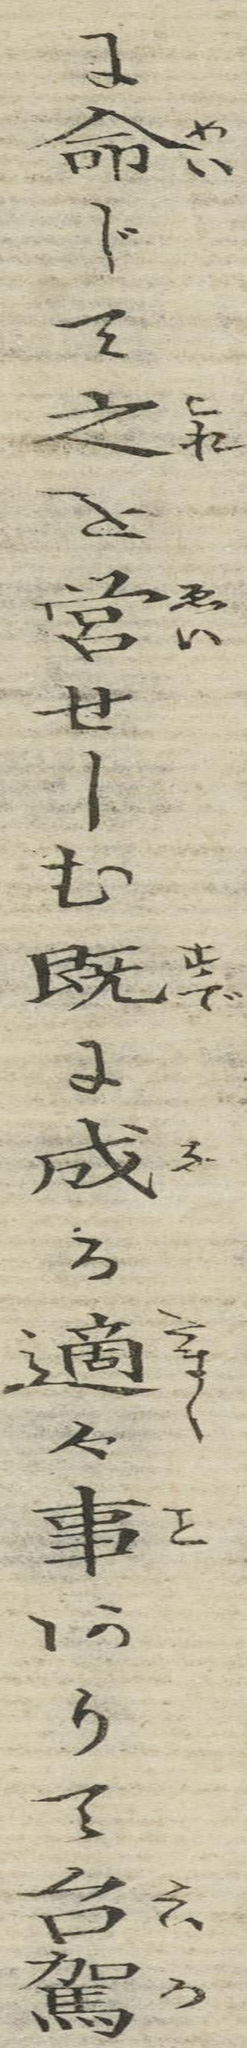に命じて之を営せしむ既に成る適々事ありて台駕
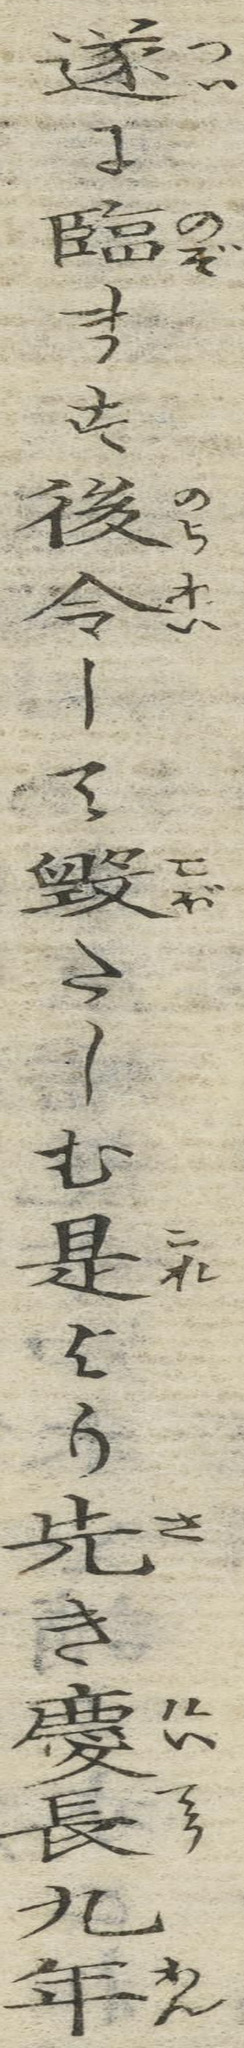遂に臨ます後令して毀たしむ是より先き慶長九年
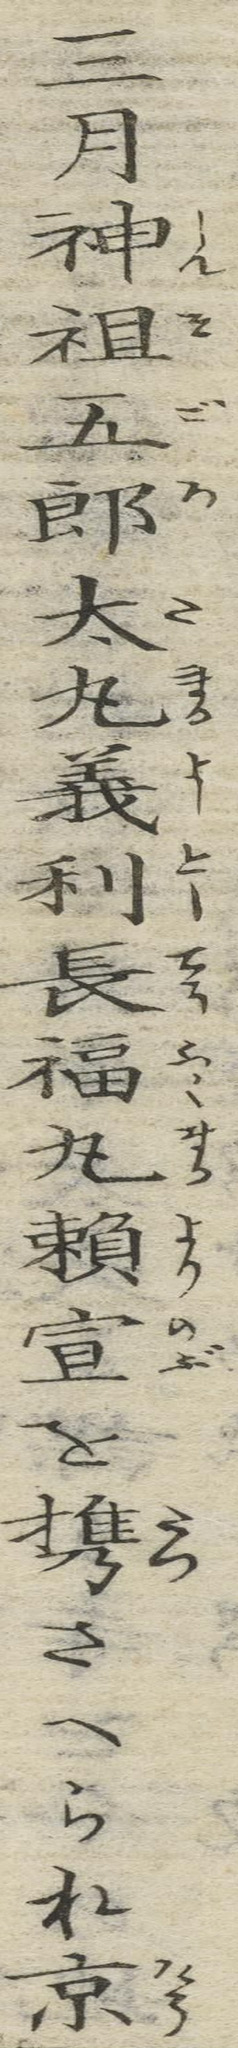三月神祖五郎太丸義利長福丸頼宜を携さへられ京
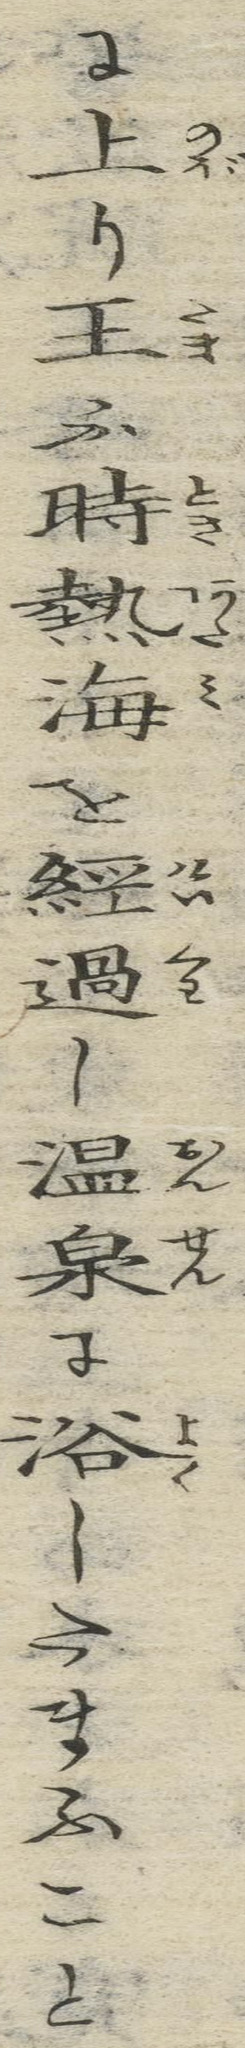に上り玉ふ時熱海を経過し温泉に浴したまふこと
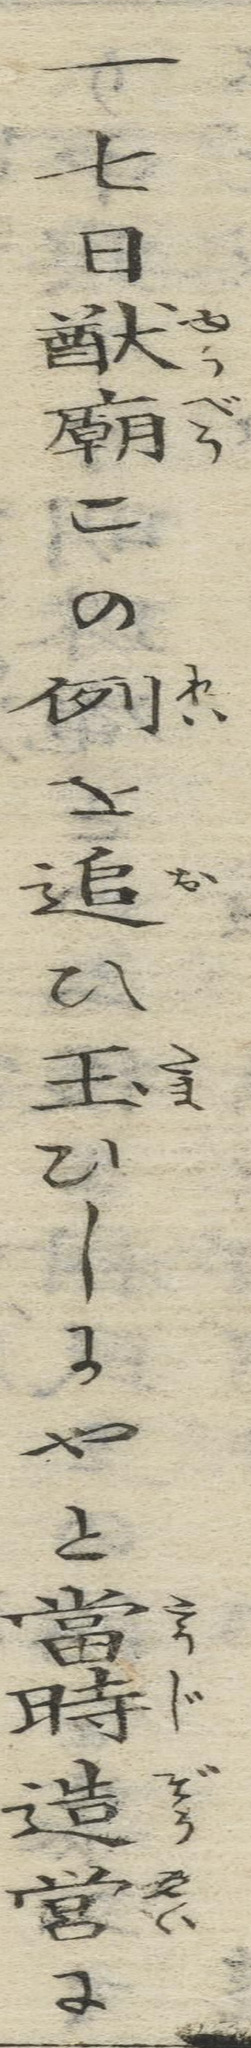一七日猷廟この例を追ひ玉ひしにやと当時造営に
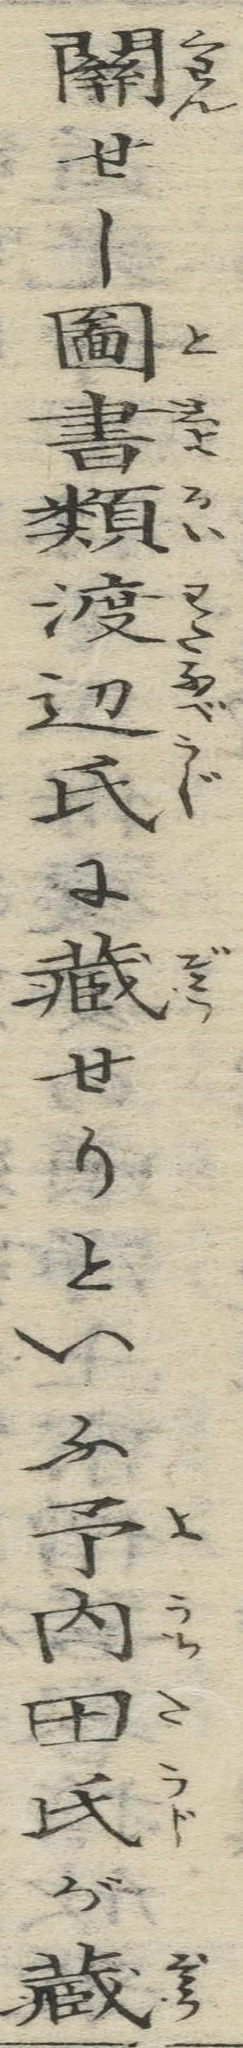関せし図書類渡辺氏に蔵せりといふ予内田氏が蔵
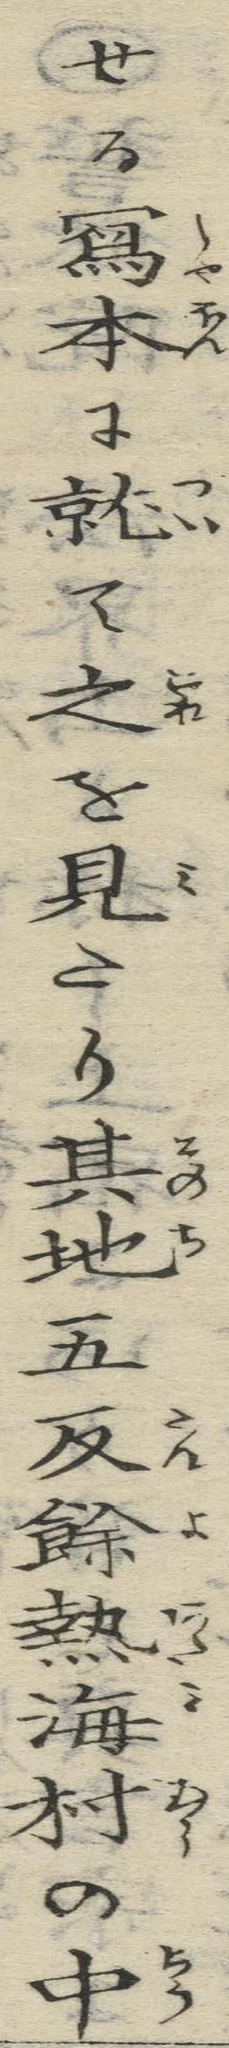せる写本に就て之を見たり其地五反余熱海村の中
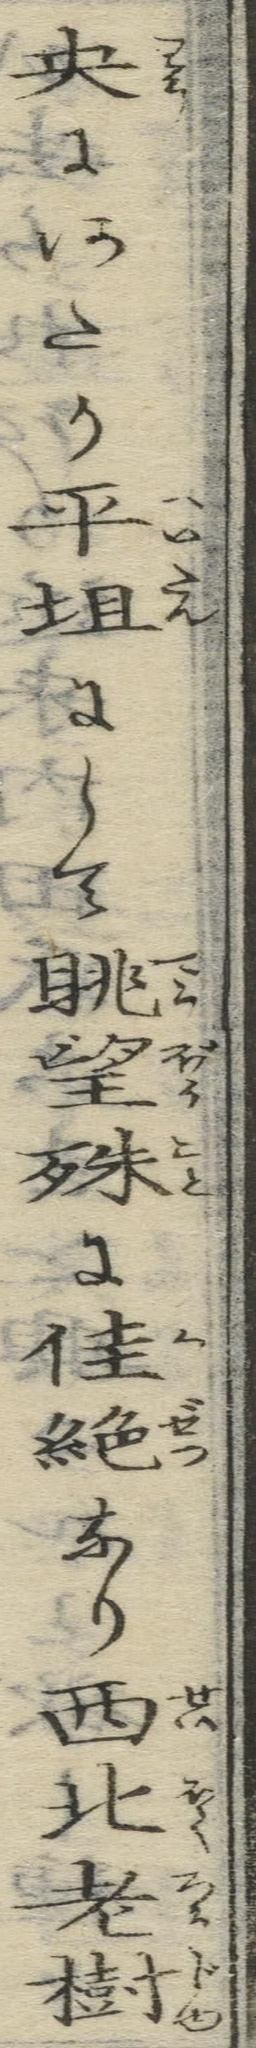央にあたり平坦にして眺望殊に佳絶なり西北老樹
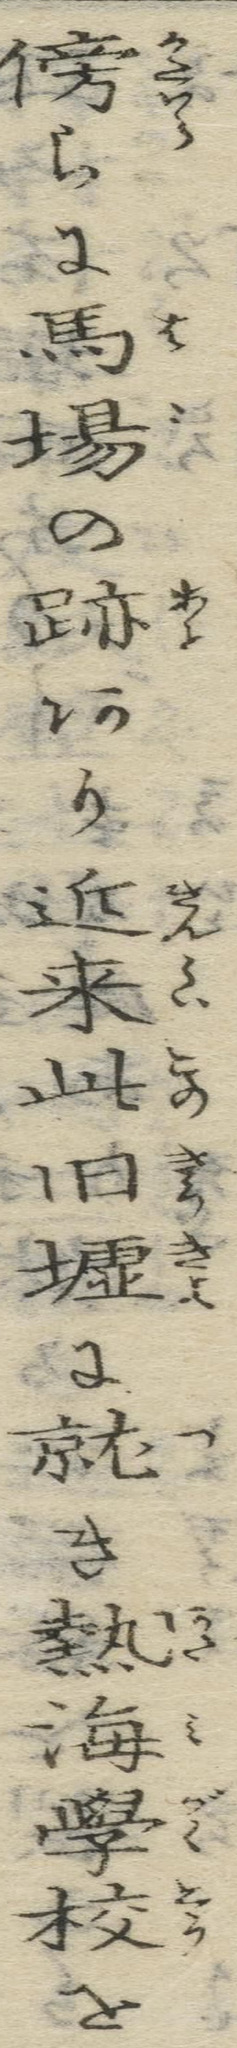傍らに馬場の跡あり近来此旧墟に就き熱海学校を
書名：豆州熱海誌　完
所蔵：東京大学地震研究所図書室 Earthquake Research Institute Library, The University of Tokyo, JAPAN
